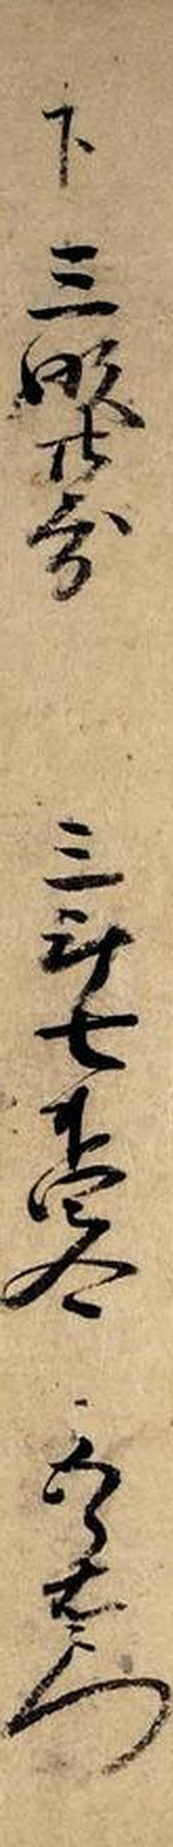下三畝廿歩三斗七升四合五郎右衛門
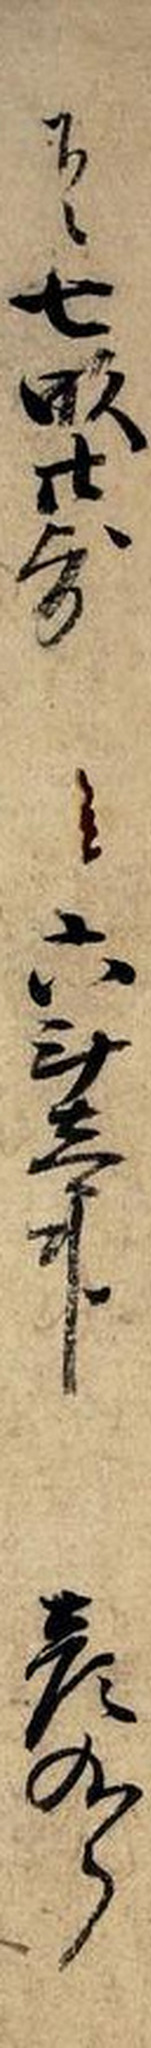下々七畝廿歩六斗壱升彦九郎
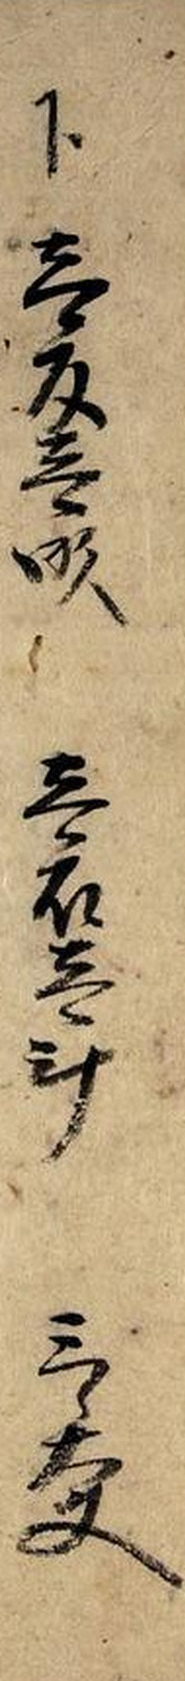下壱反壱畝壱石壱斗三郎大夫
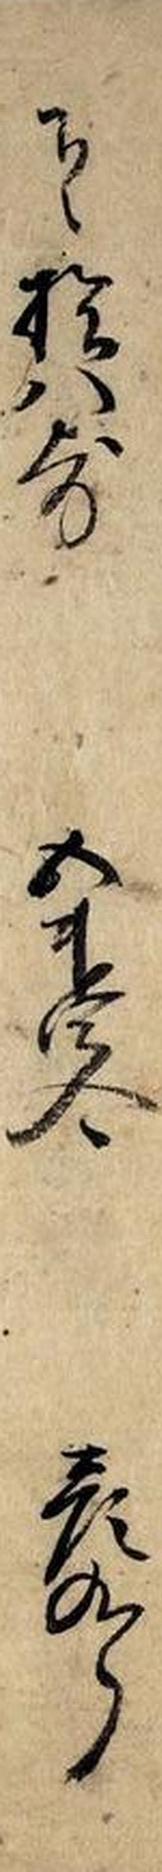下々拾八歩五升四合彦九郎
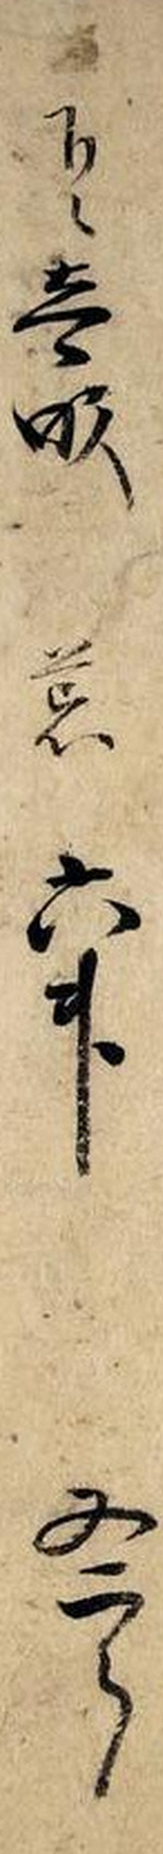下々壱畝荒六升又二郎
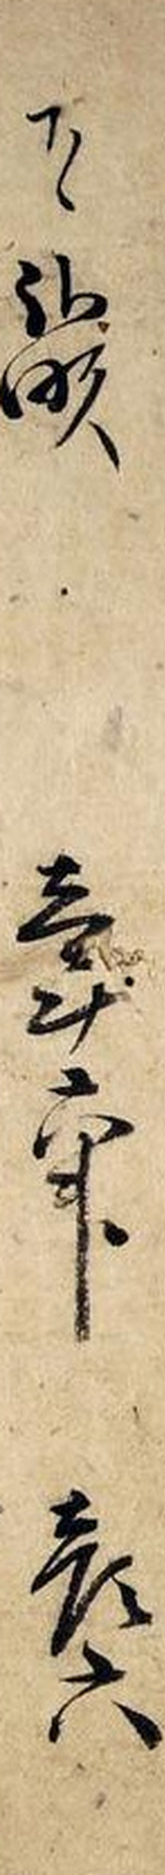下々弐畝壱斗六升彦六
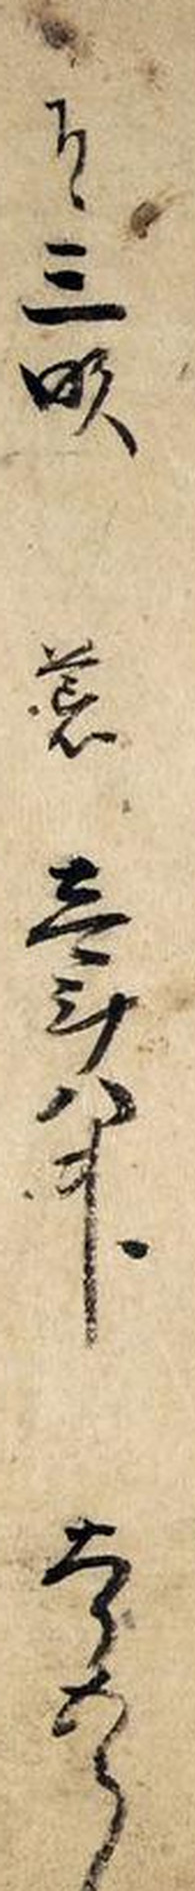下々三畝荒壱斗八升大郎五郎
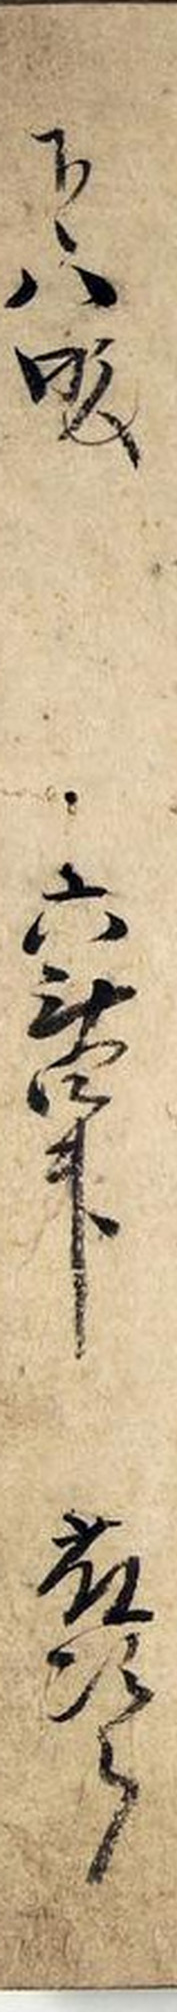下々八畝六斗四升藤次郎

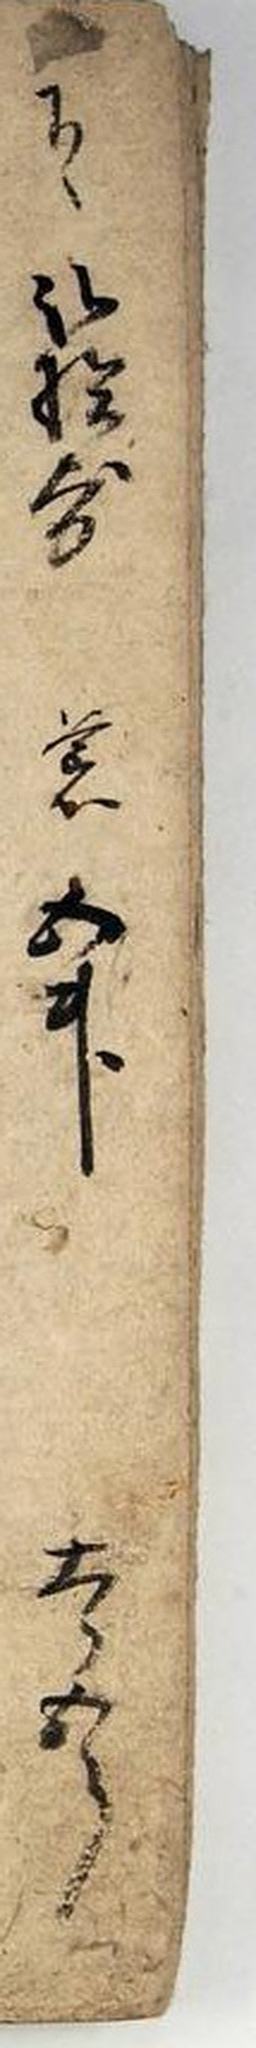下々弐拾歩荒五升大郎五郎
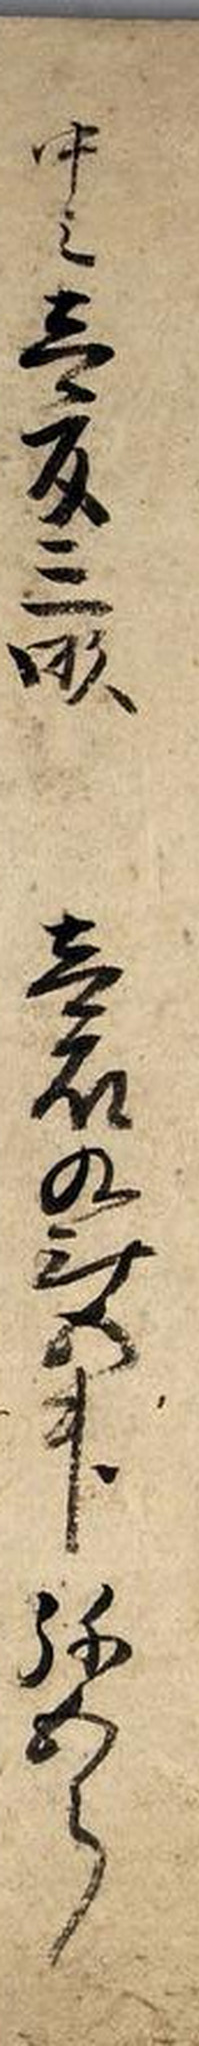中上壱反三畝壱石九斗五升弥五郎
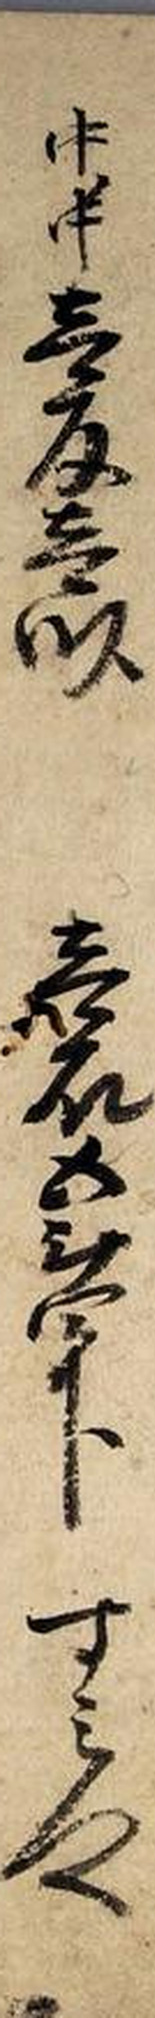中ノ中壱反壱畝壱石五斗四升すみや
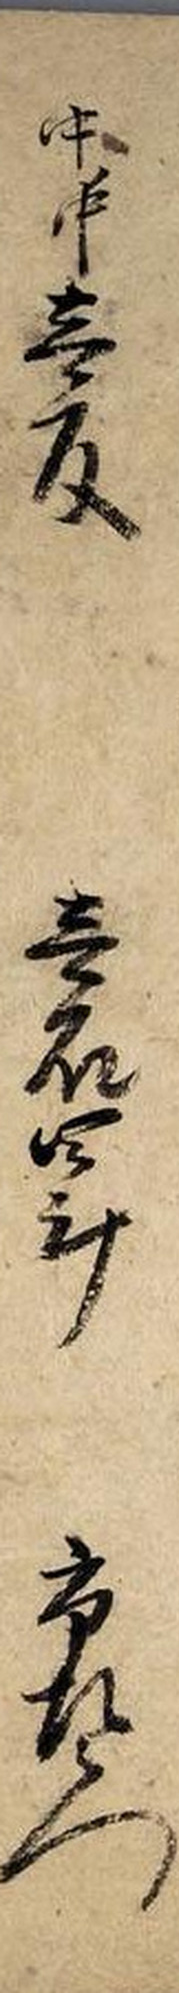中ノ中壱反壱石四斗市左衛門
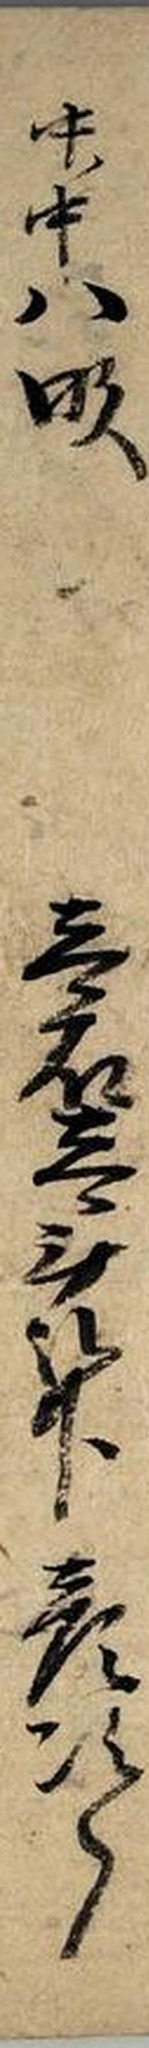中ノ中八畝壱石壱斗弐升彦次郎
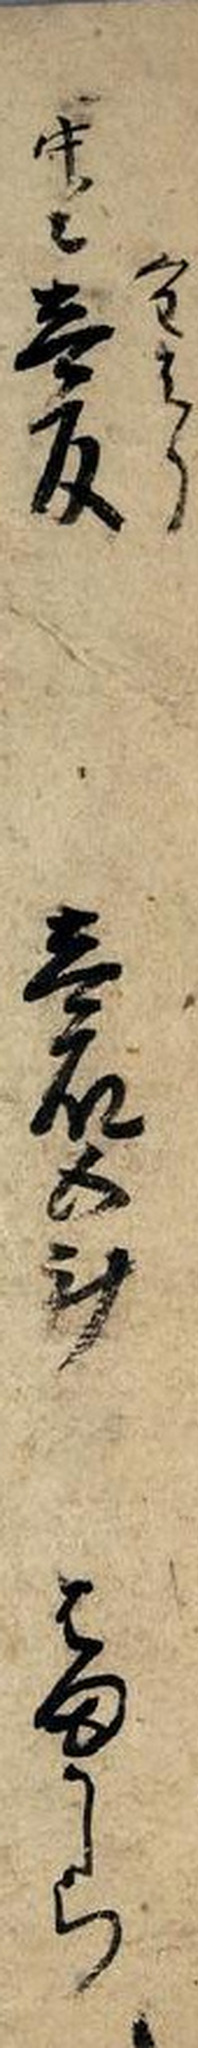中ノ上壱反壱石五斗はまかしら
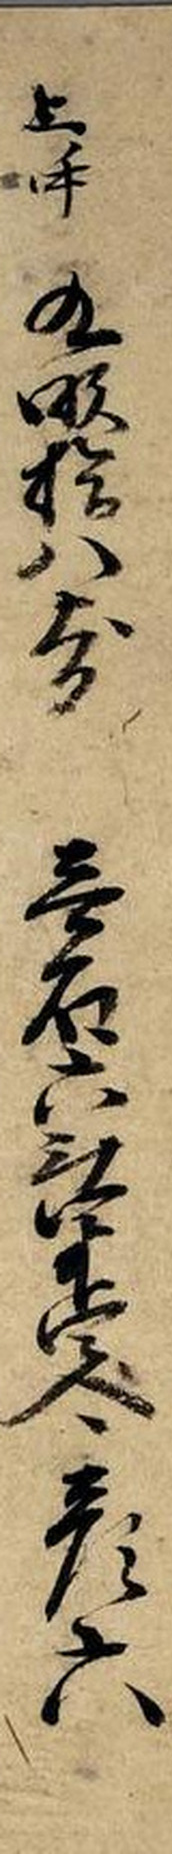上ノ中九畝拾八歩壱石六斗四升四合彦六
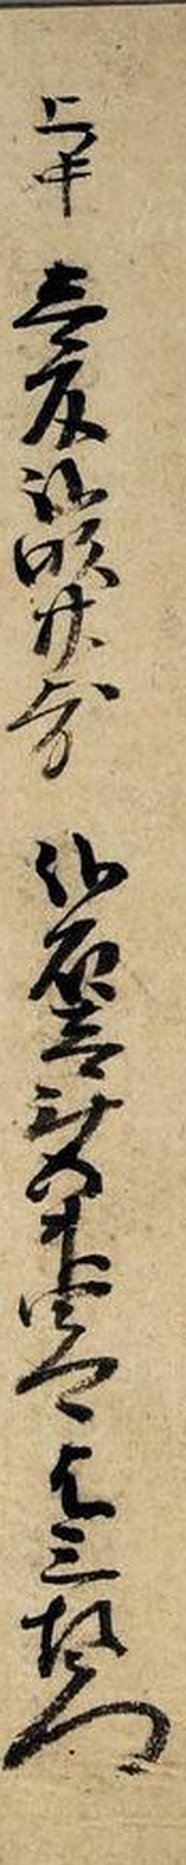上ノ中壱反弐畝廿歩弐石壱斗五升四合与三左衛門
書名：若州三方郡之内世久見浦御検地帳（世久見浦検地帳写）
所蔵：福井県文書館 Fukui Prefectural Archives
